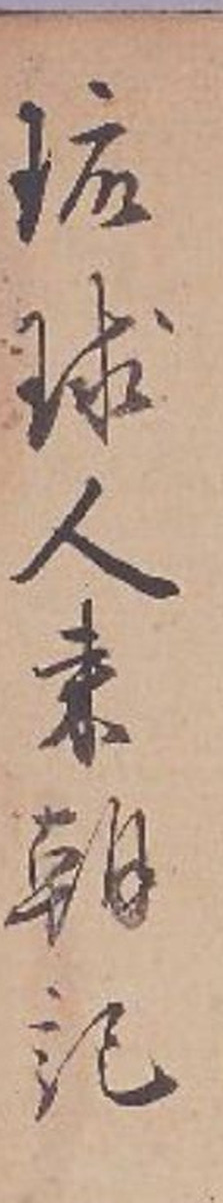琉球人来朝記

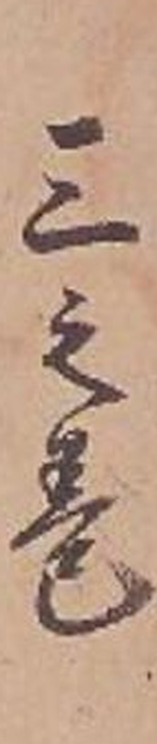三之巻
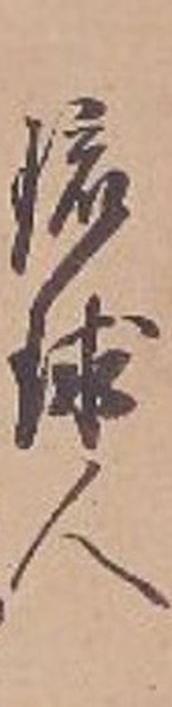琉球人
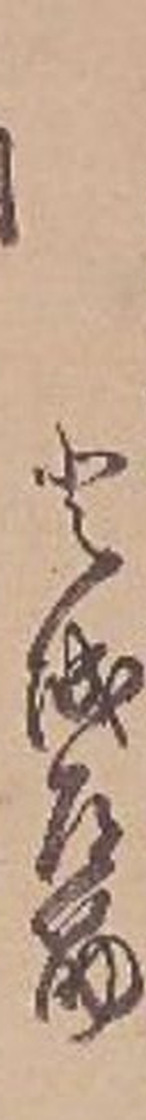登城道筋
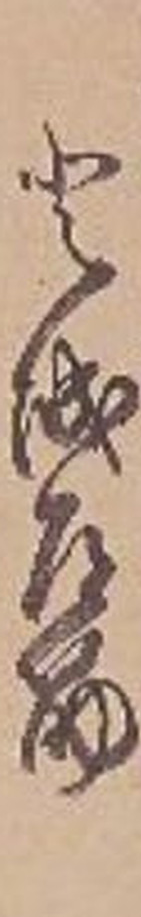登城道筋
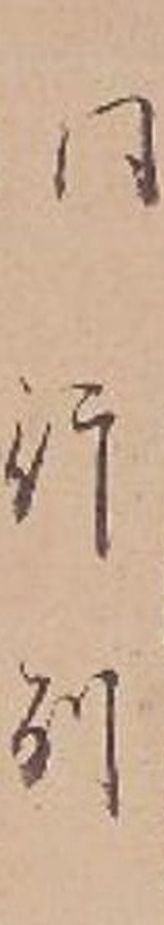同行列
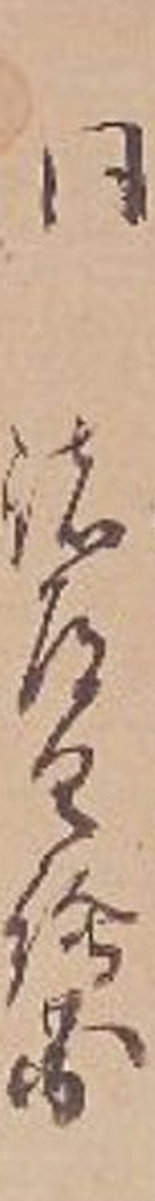同諸道具絵図
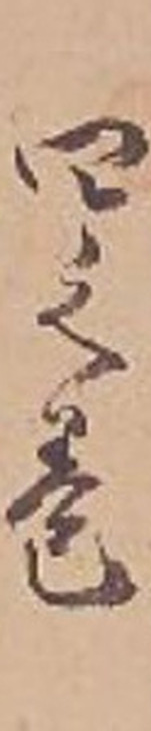四之巻
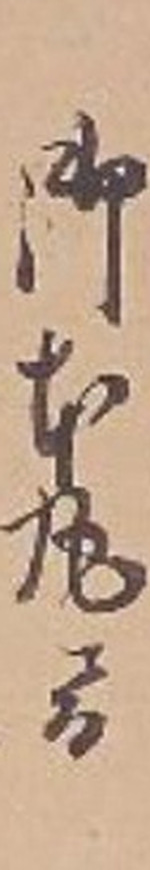御本丸に而
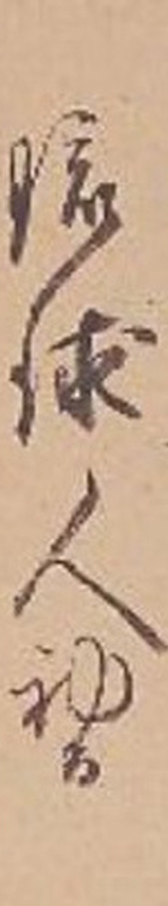琉球人初而
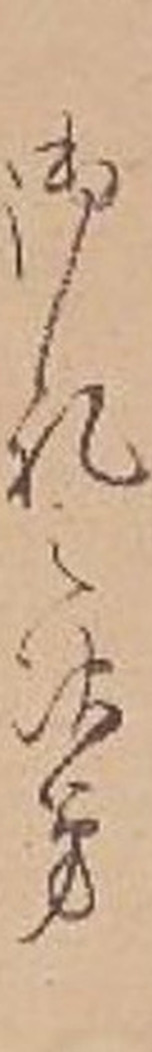御礼之次第
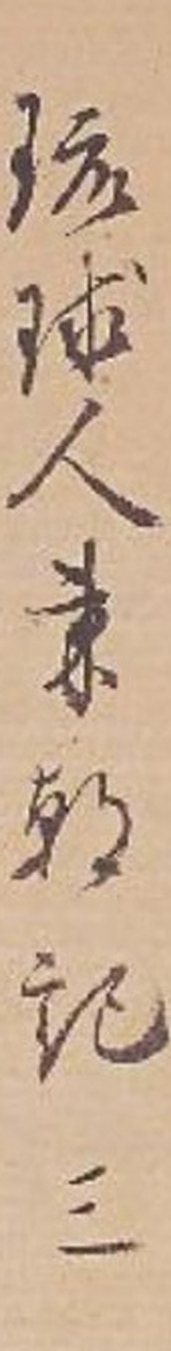琉球人来朝記三
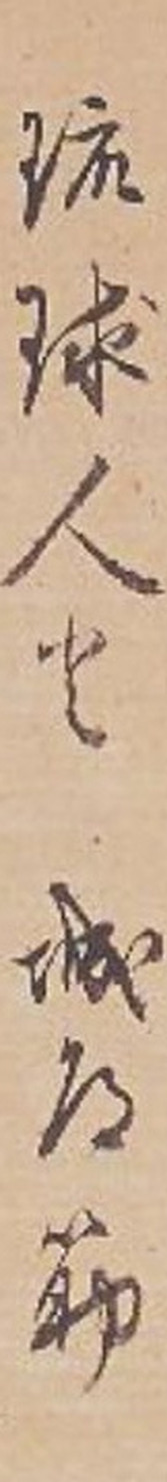琉球人登城道筋
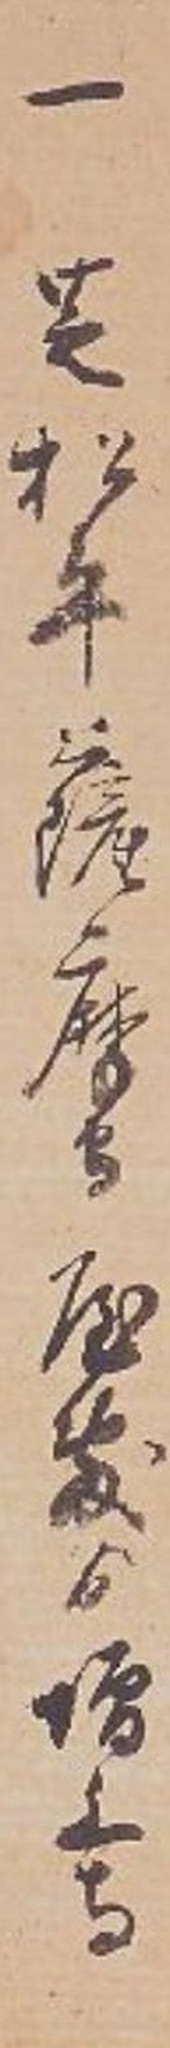一芝松平薩摩守屋敷ゟ増上寺
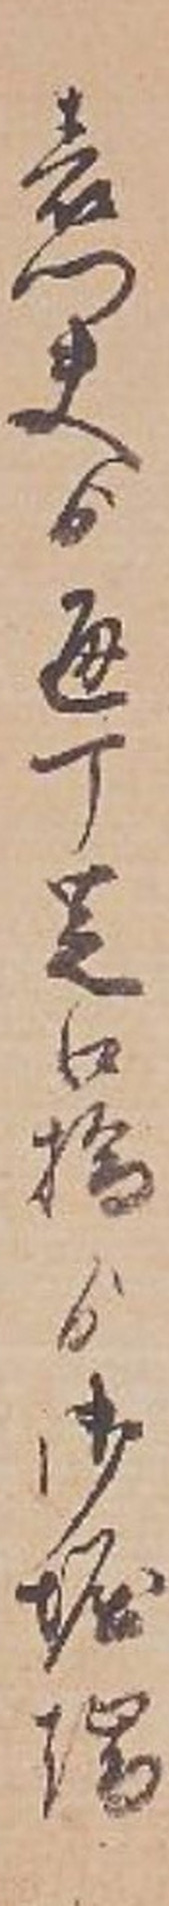表門夫ゟ通丁芝口橋ゟ御堀端
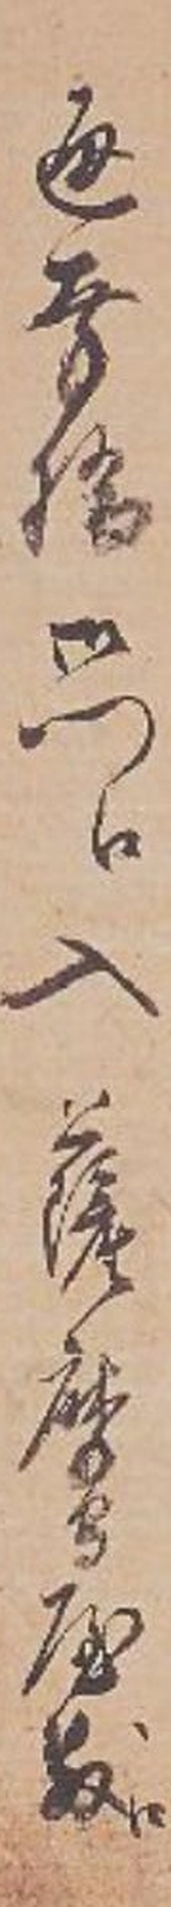通幸橋御門え入薩摩守屋敷え
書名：琉球人来朝記 三、四
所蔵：University of the Ryukyus Library
